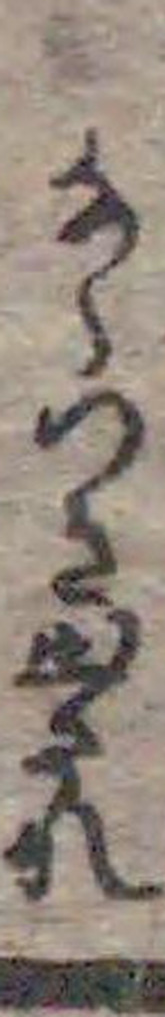なくつき出され
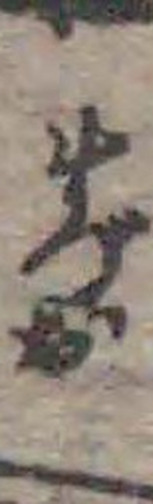まづお
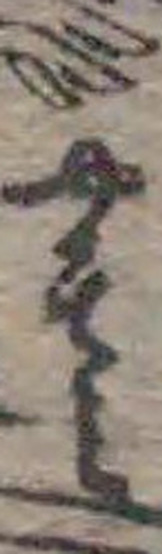やすみ
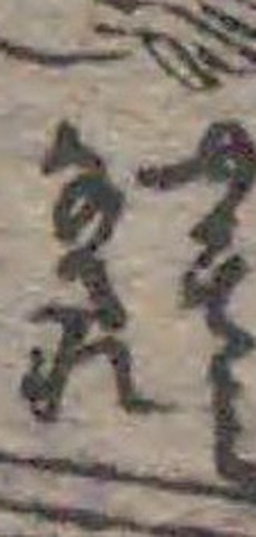なされ
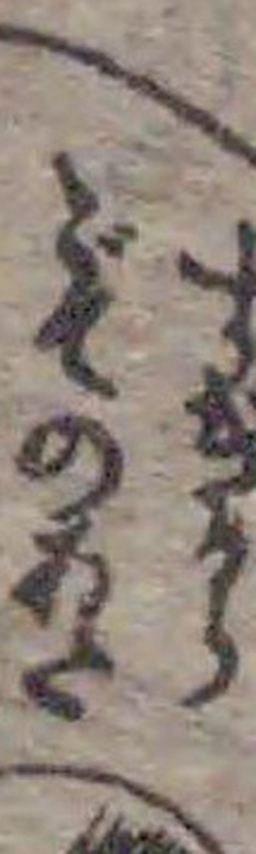どてのあた
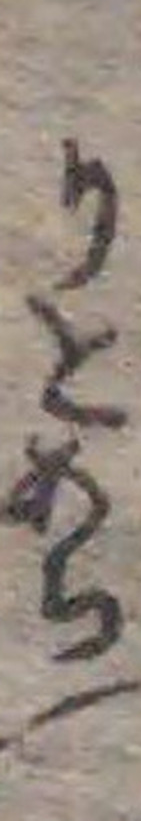りをあち
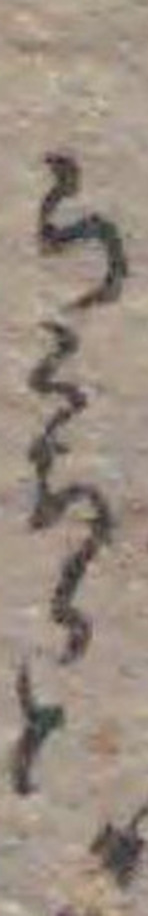らこちらと
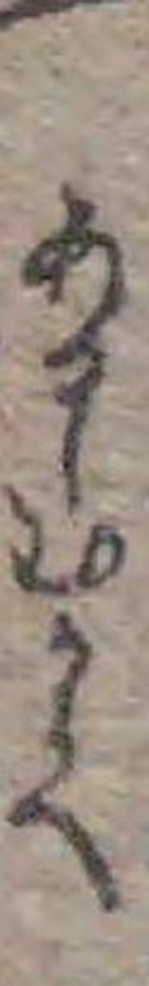あるしむかうへ
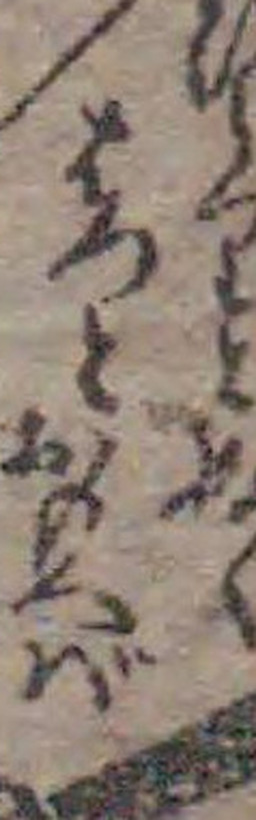はつとおもへば
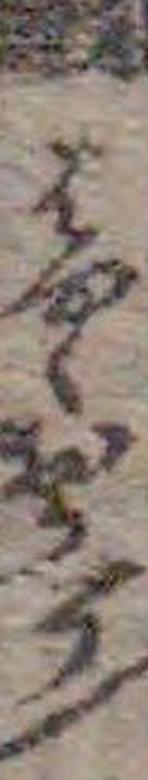はやくおかへり
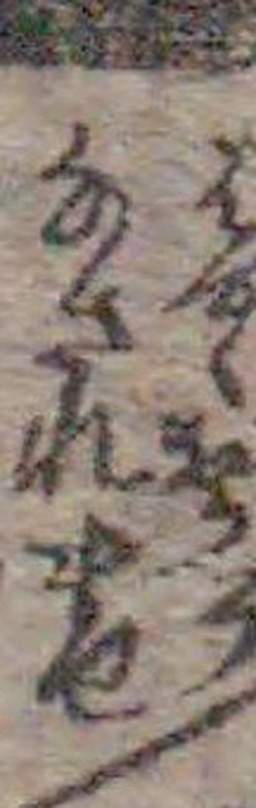なされませ
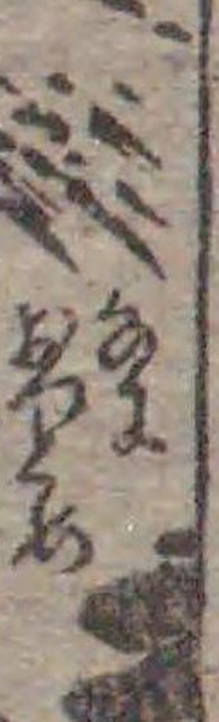おつと
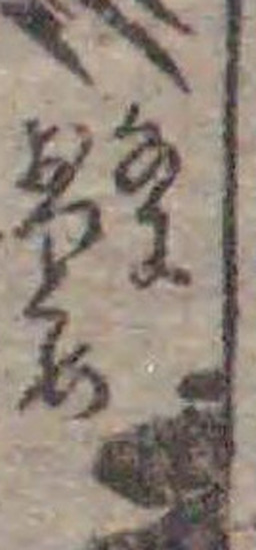おつとめ
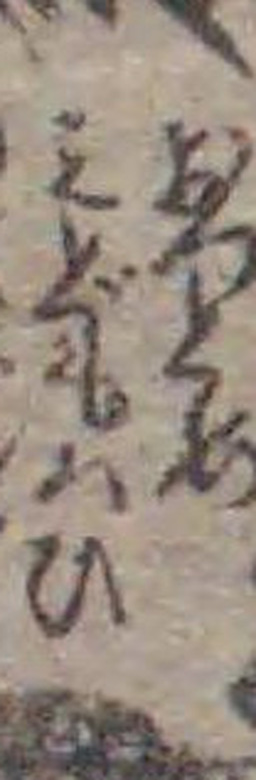みどもはひ
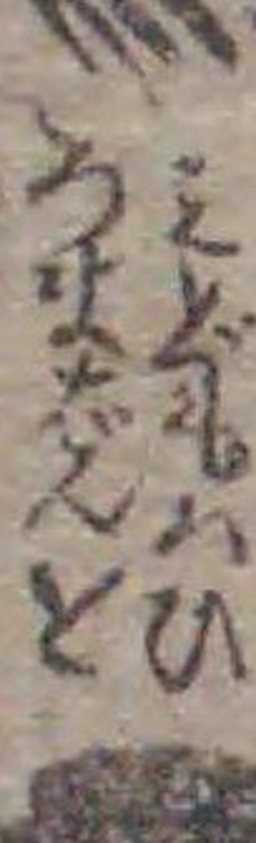ろまばんを
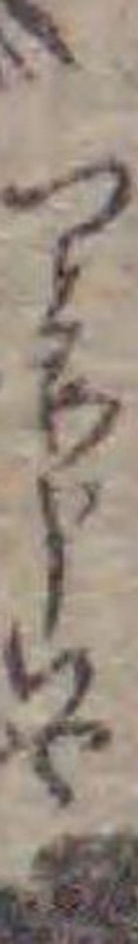つとめ申いや
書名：見徳一炊夢 : 3巻
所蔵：国立国会図書館 National Diet Library, JAPAN
